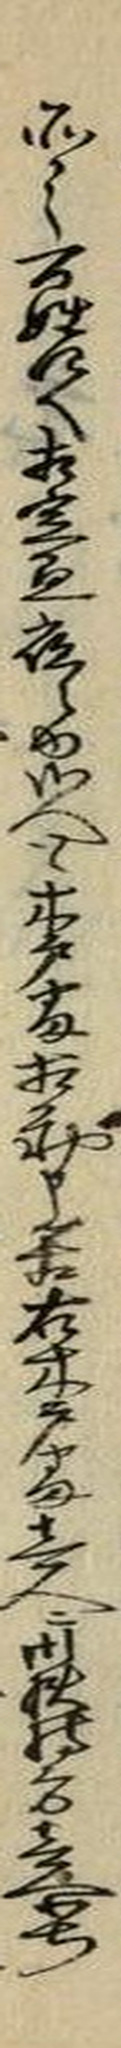所之百姓四人相定置夜之内弐人ツヽ木戸番相勤申筈右木戸番壱人ニ御扶持方壱人ふち
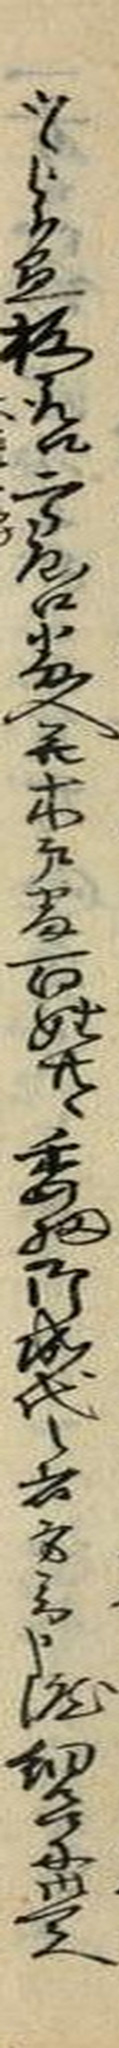ツヽ被下置板取口二ツ屋口番人幷木戸番百姓共へ委細御城代之者方ニ而申渡細呂木御関
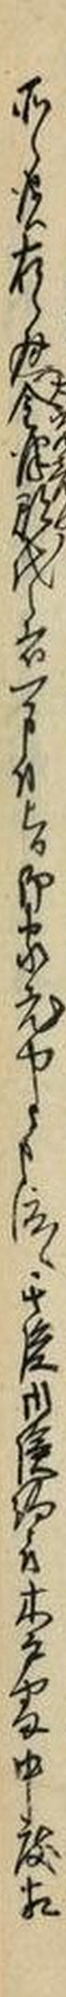所之儀ハ右之通大宮彦右衛門金津郡代之者可申付旨御家老中被申渡候其後御倹約ニ付木戸番中度相
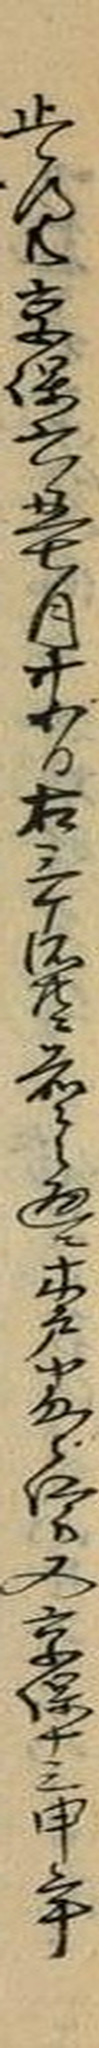止候得共享保六丑七月廿五日右三ケ所共ニ前々之通ニ木戸番被仰付又享保十三申年
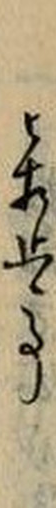被相止候事
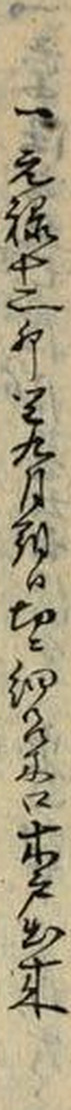一元禄十二卯閏九月朔日切ニ細呂木口木戸出来
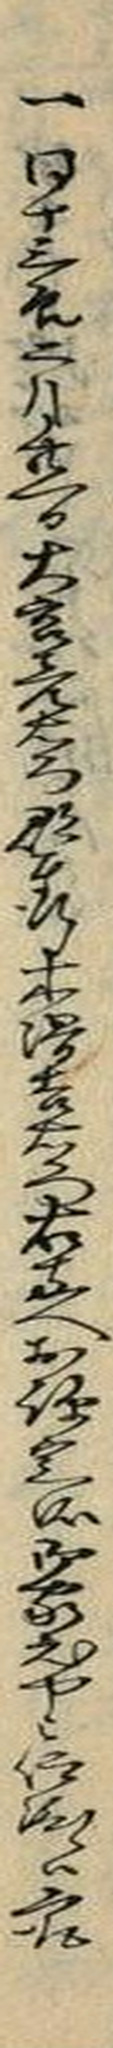一同十三辰二月廿一日大宮彦右衛門郡奉行木滑吉右衛門右両人於評定所御家老中被仰渡候ハ最
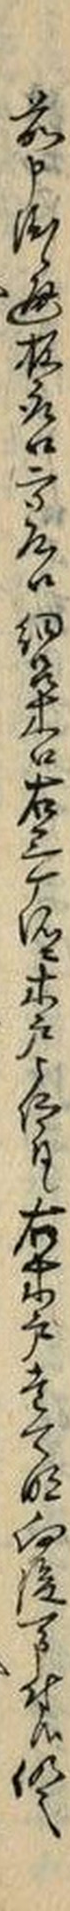前申渡候通板取口二ツ屋口細呂木口右三ケ所ニ木戸被仰付候右木戸走可明向後可申付候仍之
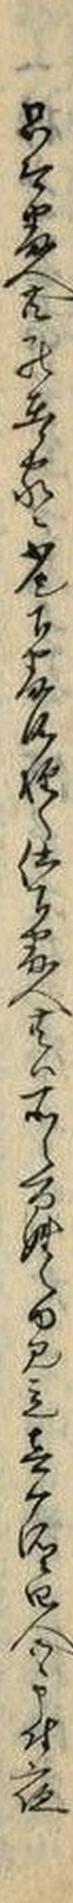只今番人共罷在候家ニ少シ下番所軽く仕下番人共ハ所之百姓之内見立壱ケ所ニ四人ツヽ申付夜
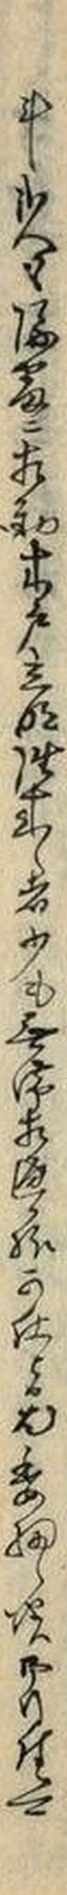斗弐人ツヽ隔番ニ相勤木戸立明往来之者少も無滞相通候様可仕旨尤委細之儀ハ御目付へ可
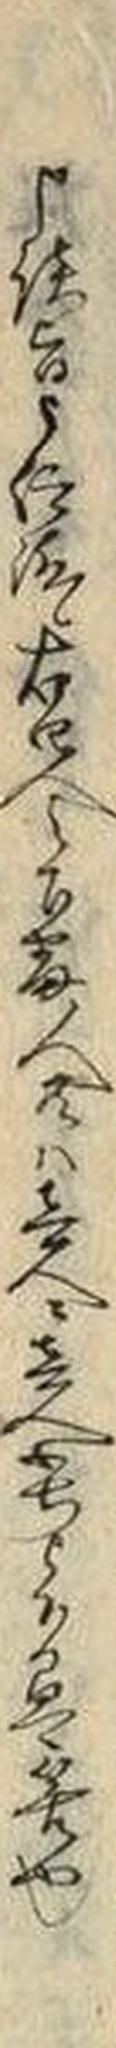申談旨被仰渡候右四人之下番人共ハ壱人ニ壱人ふち被下置候筈也
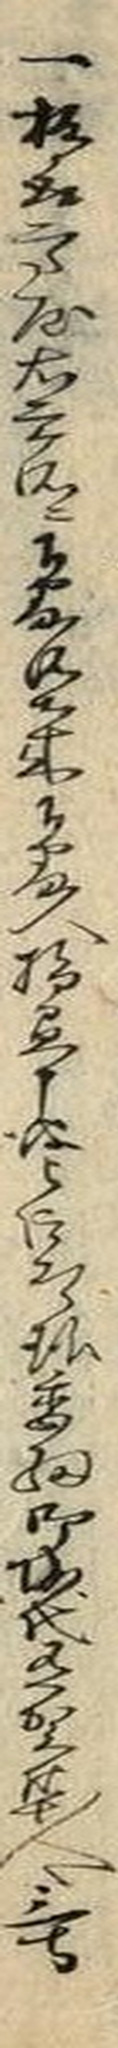一板取二ツ屋右二ケ所ニ下番所出来下番人指置申儀被仰出候趣委細御城代有賀隼人へ三寺
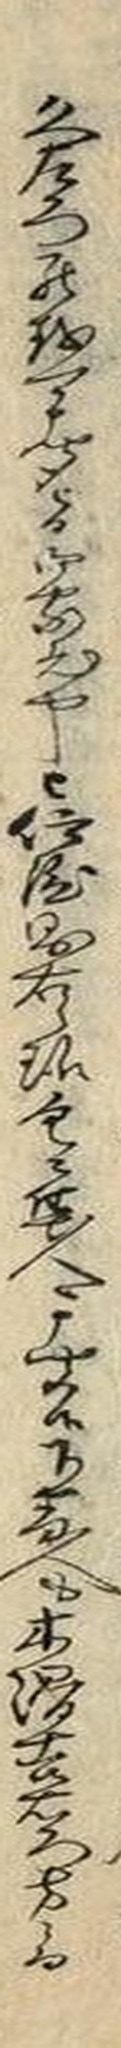久左衛門罷越可申聞旨御家老中被仰渡則右之趣具ニ隼人へ申聞候下番人も木滑吉右衛門方ニ而
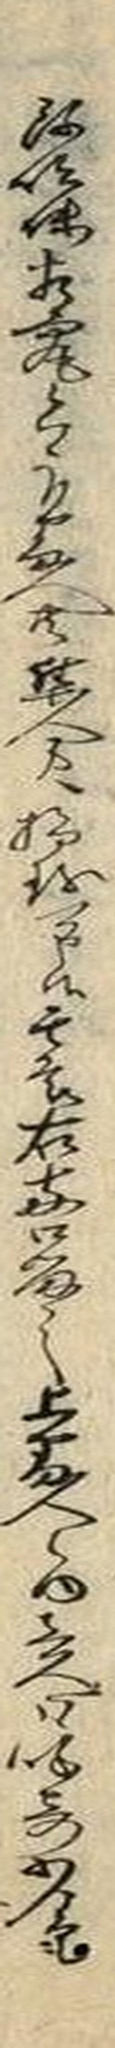致吟味相究候ハヽ下番人共隼人方へ指越可申候其節右両口留之上番人之内壱人ツヽ呼寄少ニ而も
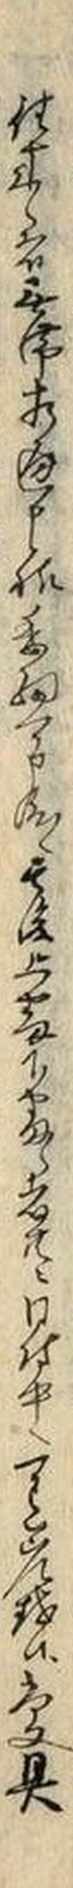往来之者無滞相通申候様委細可申渡候其後上番下番之者共ニ目付中へ可被差越候尚又具
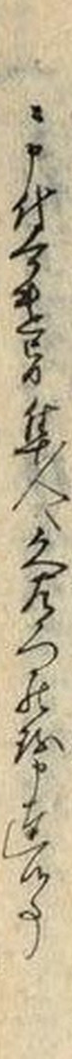ニ申付可遣旨隼人へ久左衛門罷越申達候事
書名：御国他国諸事之部
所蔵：福井県文書館 Fukui Prefectural Archives
